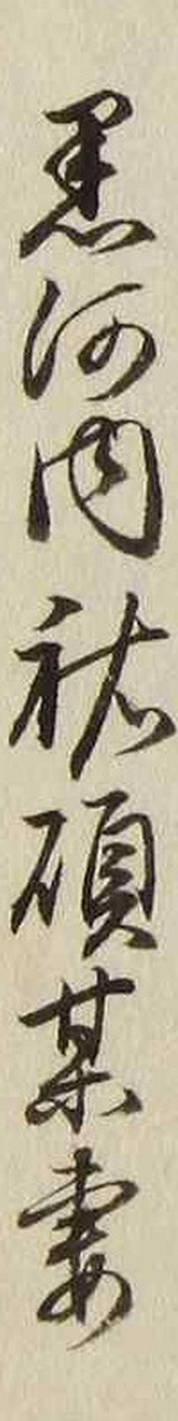女黒河内祐碩某妻
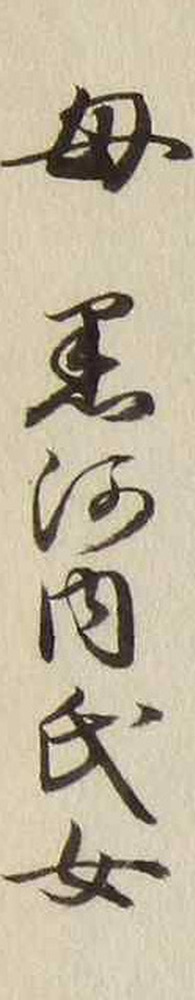母黒河内氏女

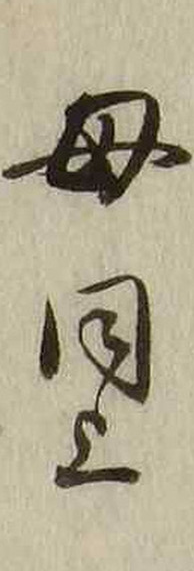母同上
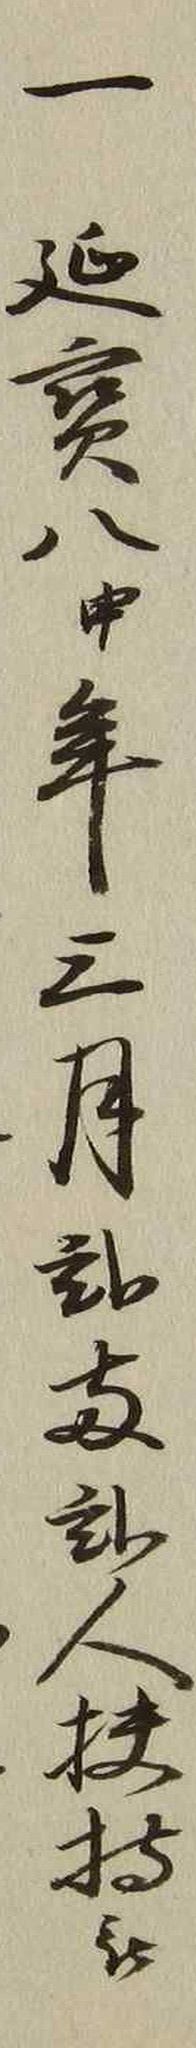一延宝八申年三月弐両弐人扶持被
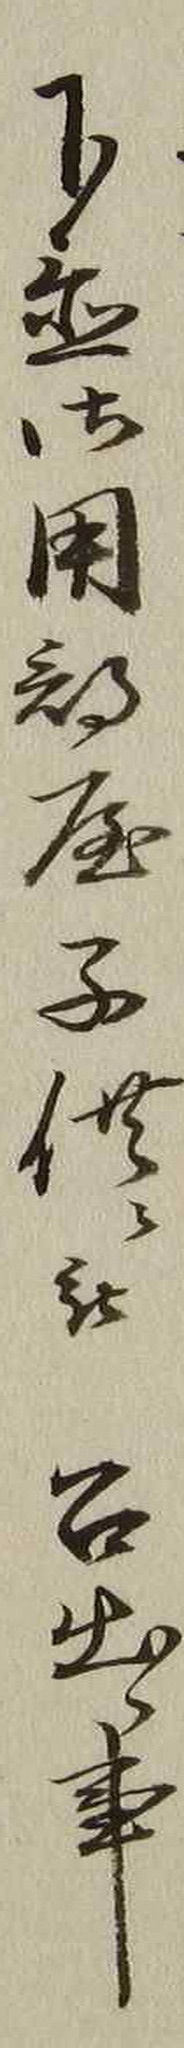下置御用部屋子供ニ被召出候事
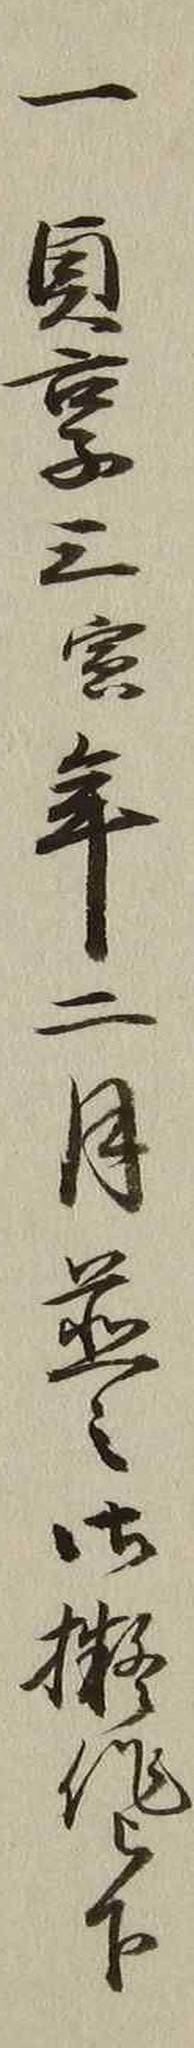一貞享三寅年二月並之御擬作被下
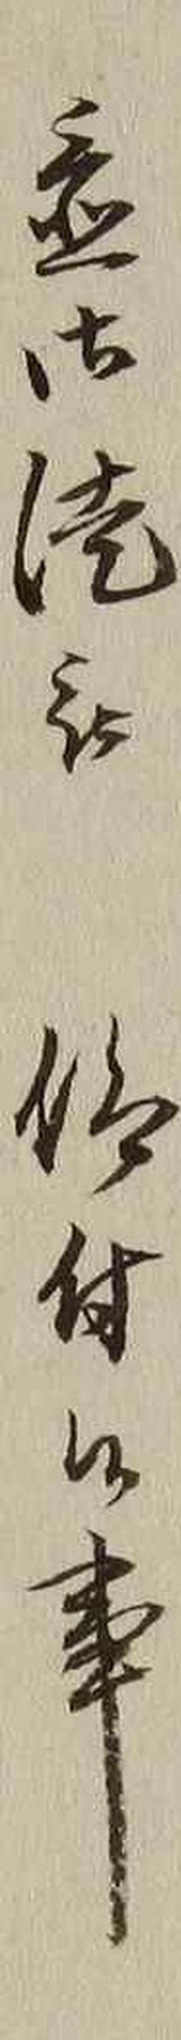置御徒被仰付候事
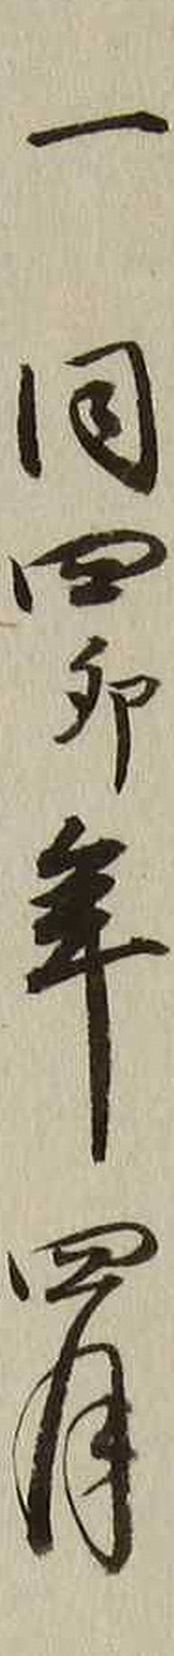一同四卯年四月
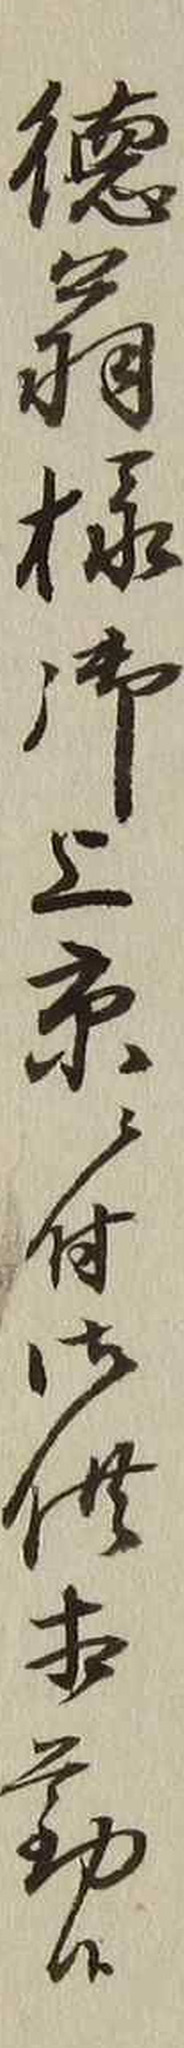徳翁様御上京ニ付御供相勤候
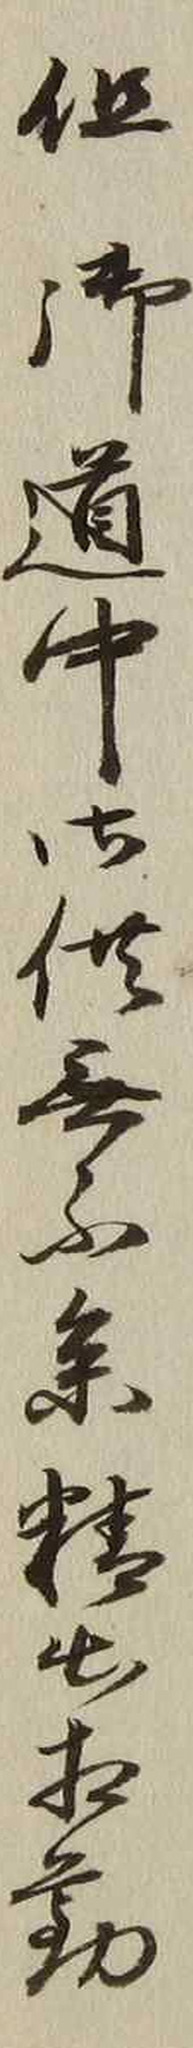但御道中御供無不参精出相勤
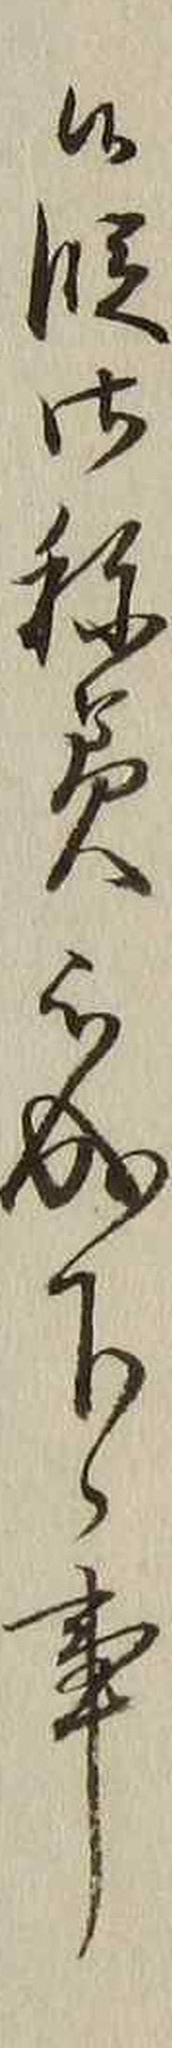候段御称美被成下候事
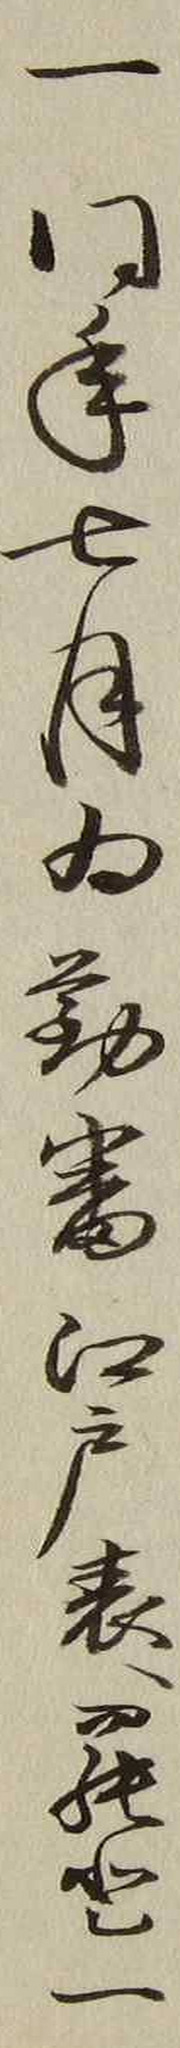一同年七月為勤番江戸表へ罷登一
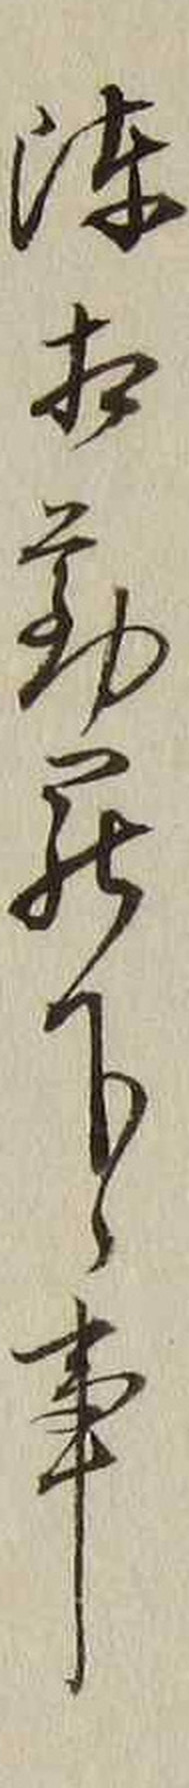陣相勤罷下候事
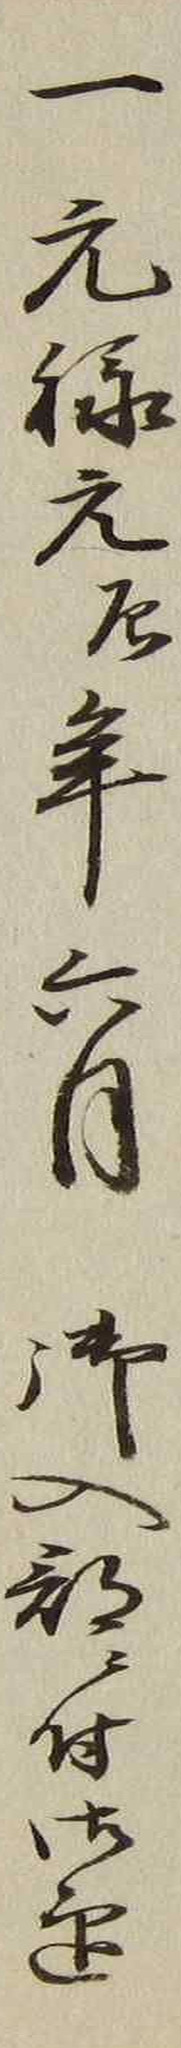一元禄元辰年六月御入部ニ付御迎
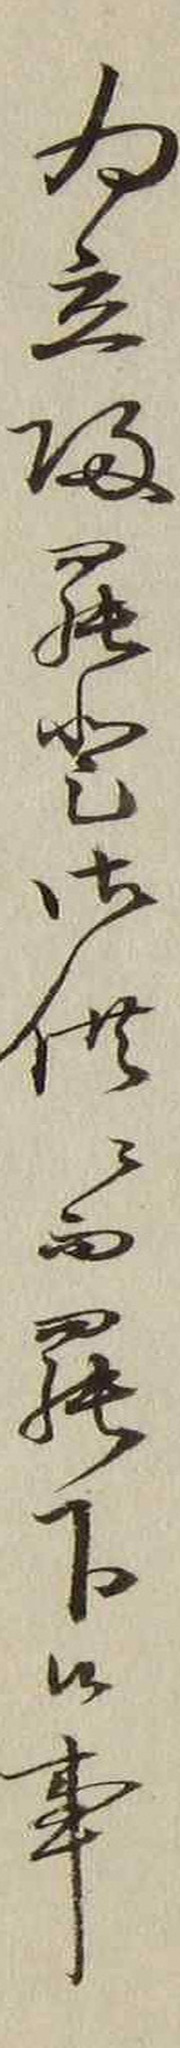為立帰罷登御供ニ而罷下候事
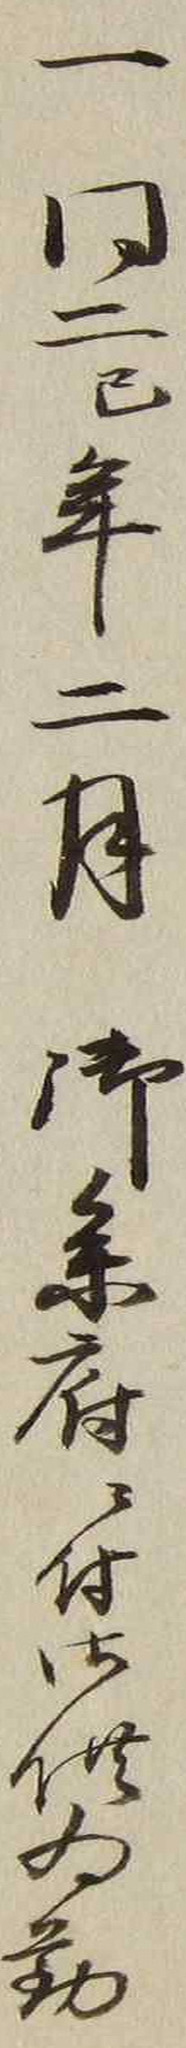一同二巳年二月御参府ニ付御供為勤
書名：諸士系譜　巻之102　か之部10
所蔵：会津若松市立会津図書館
